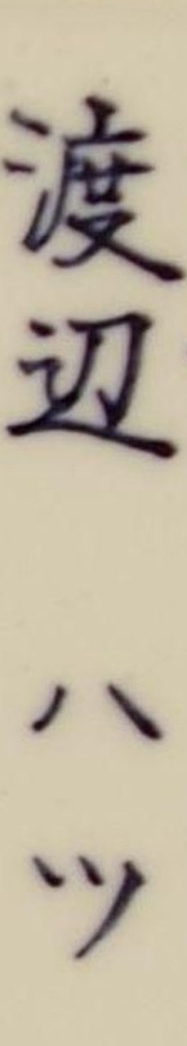渡辺ハツ
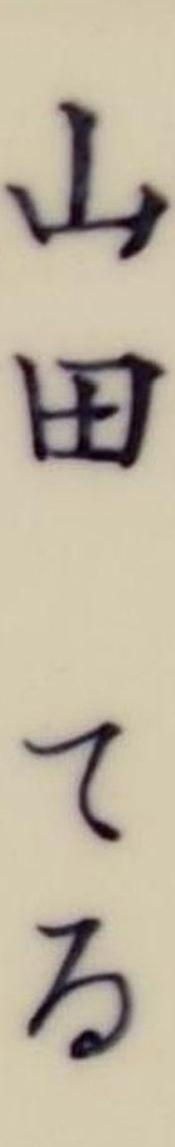山田てる
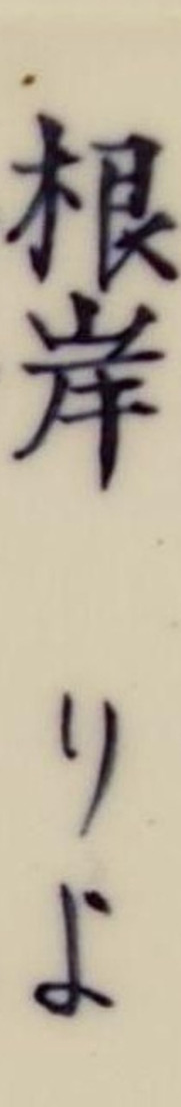根岸りよ
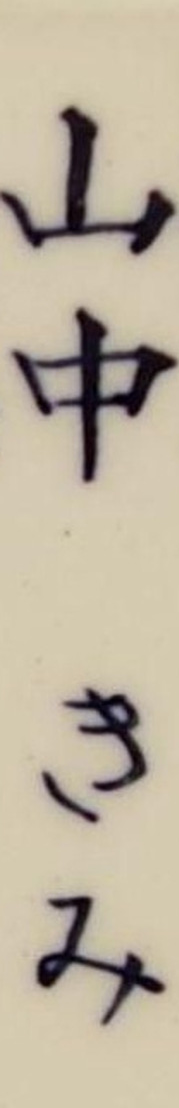山中きみ
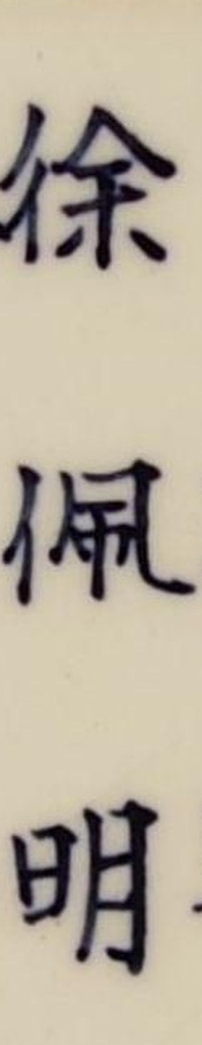徐佩明
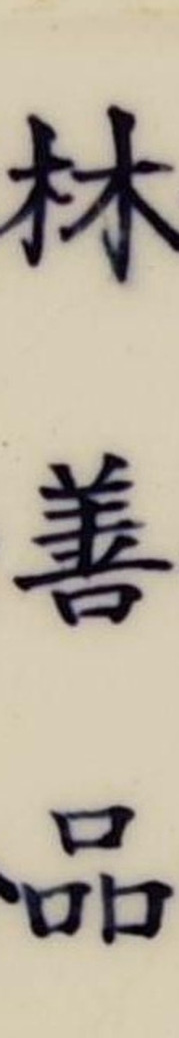林善品
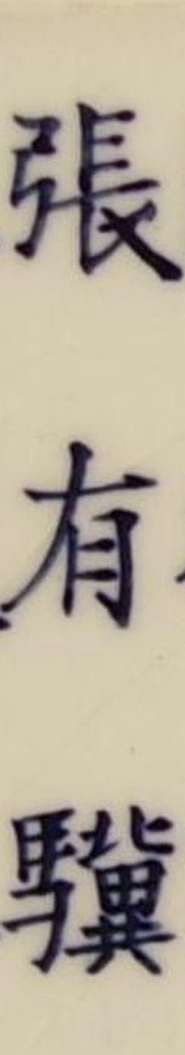張有驥
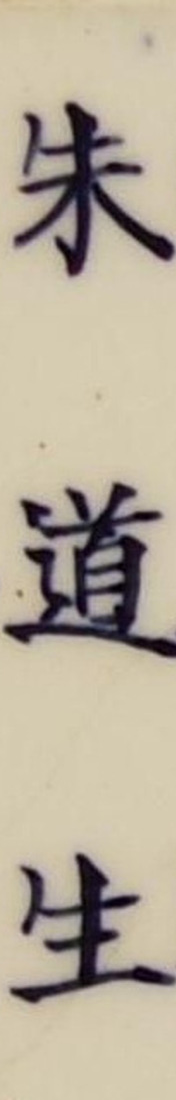朱道生
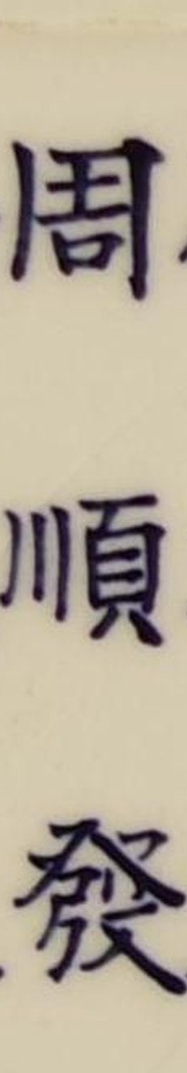周順發
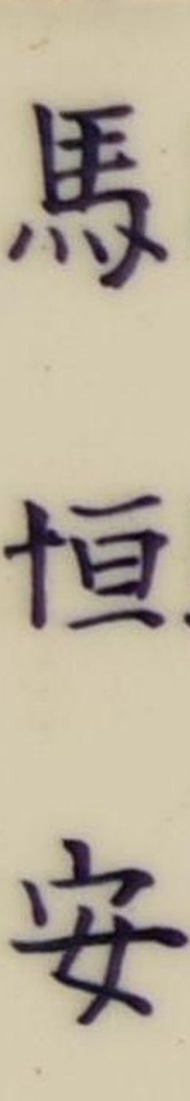馬恒安
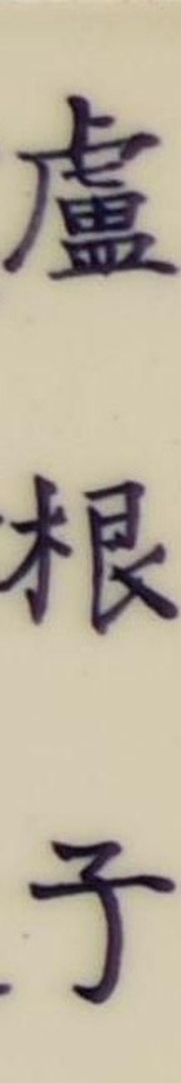盧根子

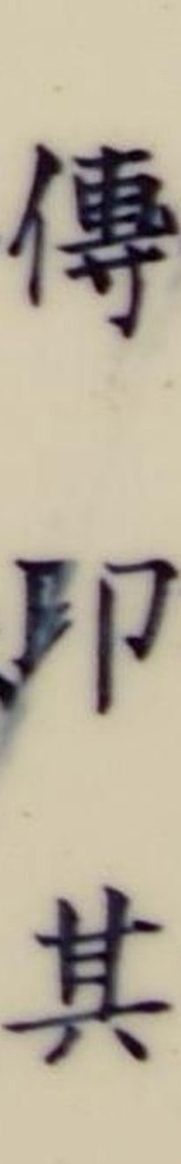傳印其
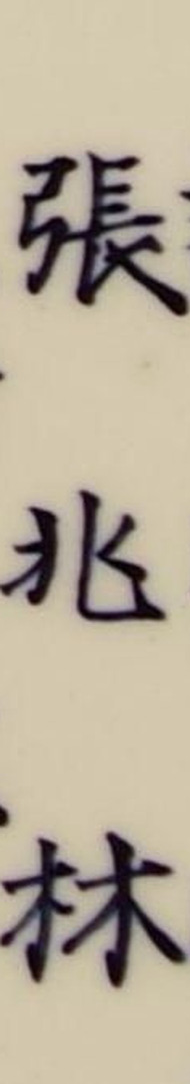張兆林
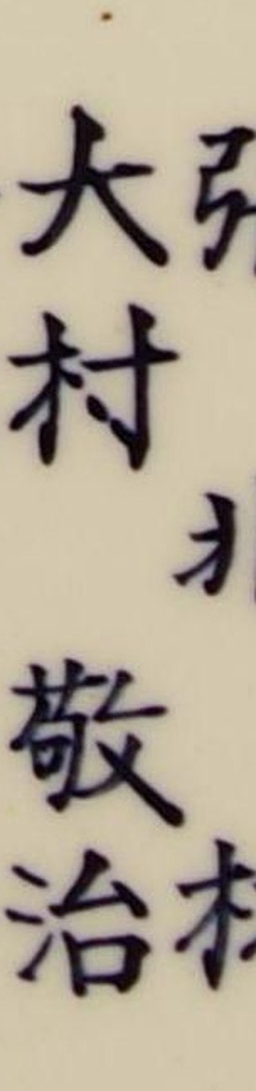大村敬治
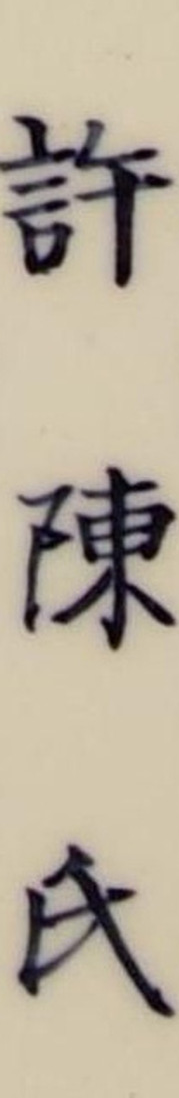許陳氏
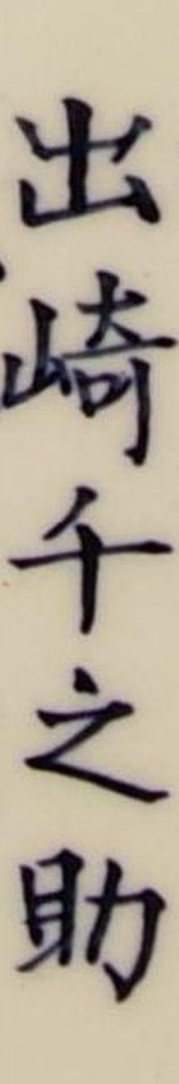出崎千之助
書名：E~L
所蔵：高野山金剛峯寺
